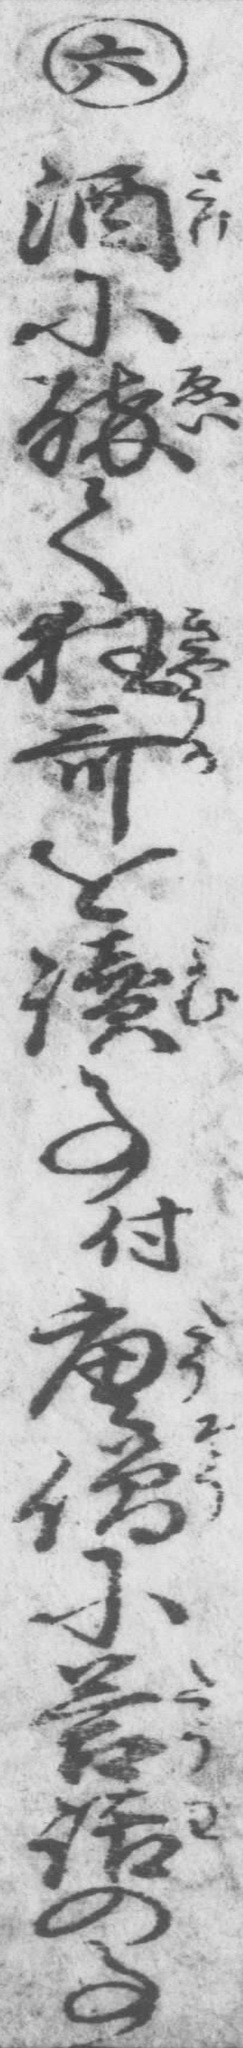六酒に酔て狂歌を読事付唐僧に答話の事
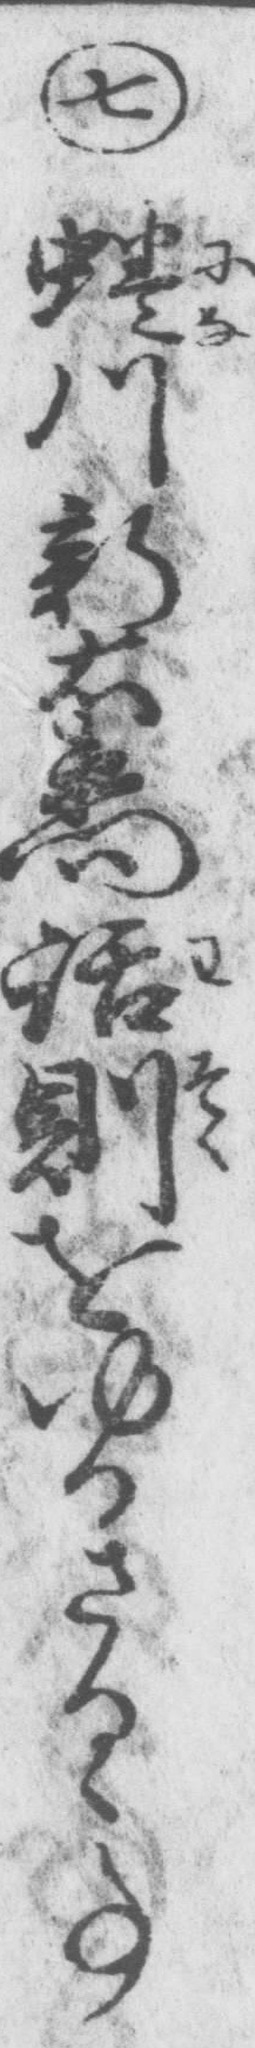七蜷川新右衛門話則をゆるさるゝ事

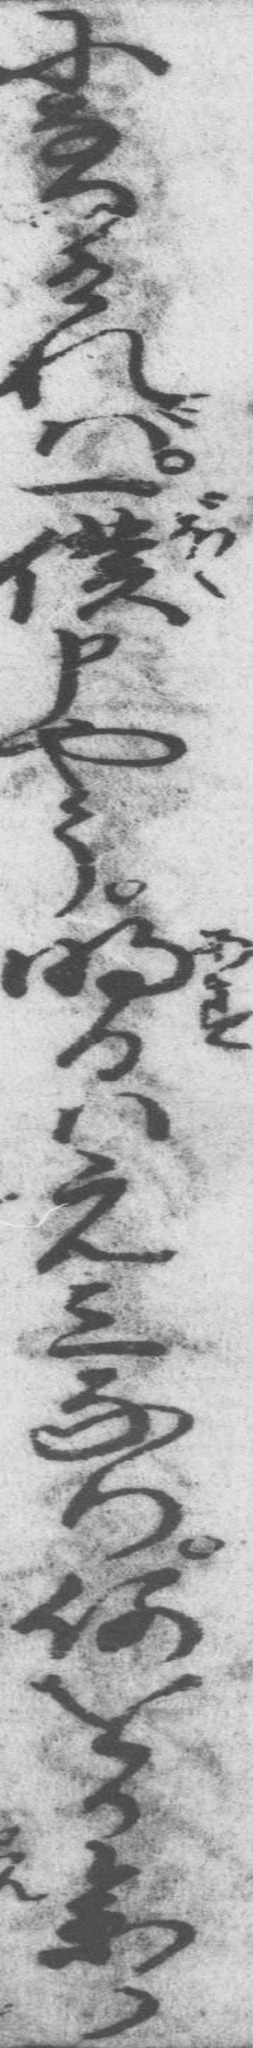になりければ。一僕申やう。明日は元三なり。何をか参ら
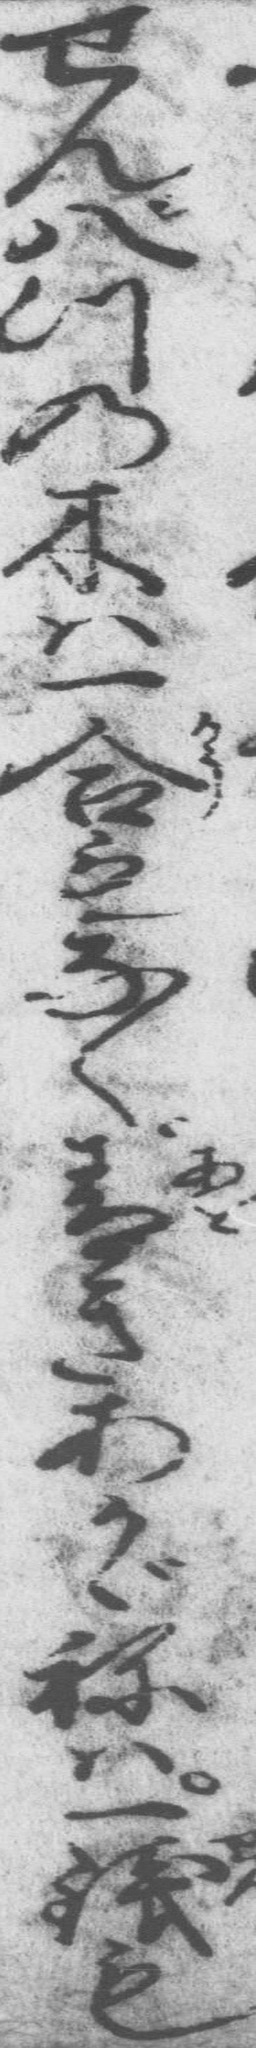せん。八つの木は一合もなく青きあかゞねは一銭も
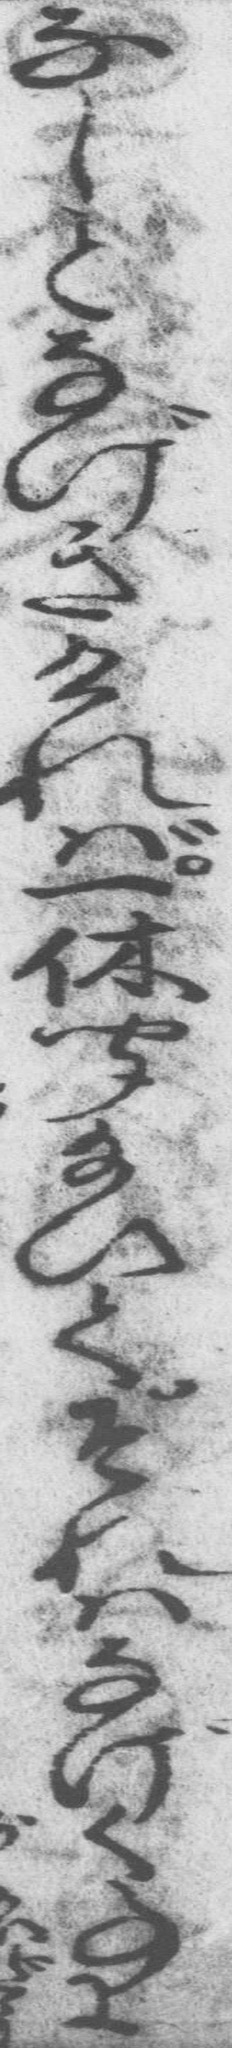なしとなげきければ。一休聞給ひて。それはなげく事に
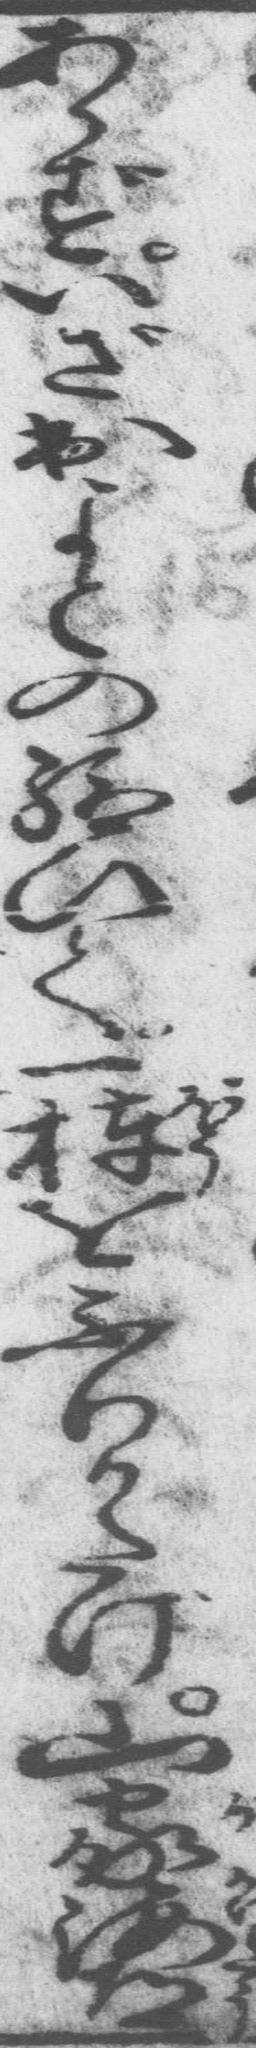あらず。いざ出よとの給ひて。一某をふりかさげ。山家海道
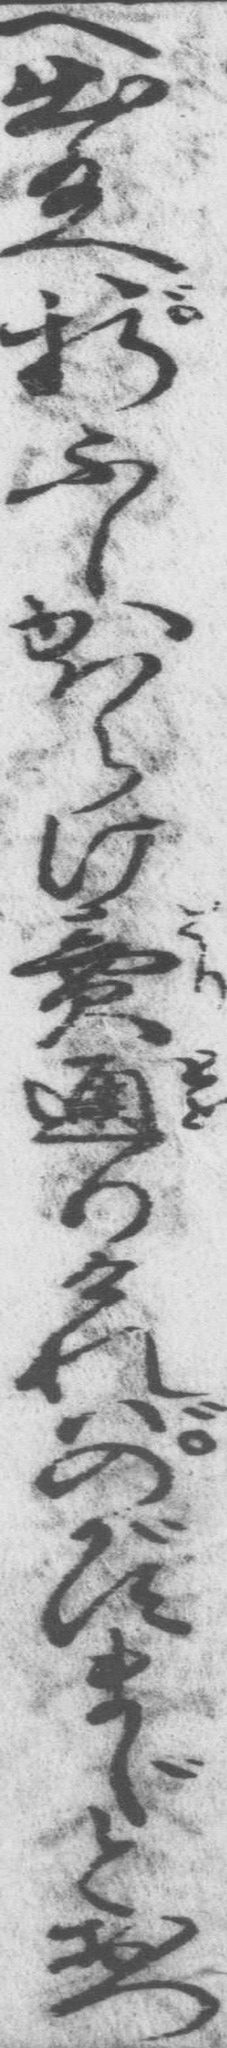へ出給へば。折ふしかはらけ売通りければ。のがすまじとおつ
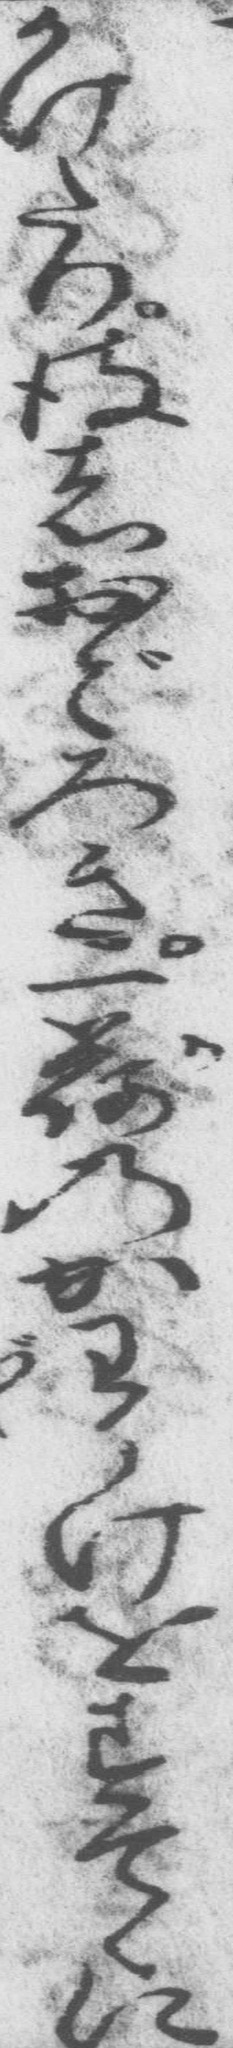かけたり。彼者おどろき。一荷のかわらけをすてゝに
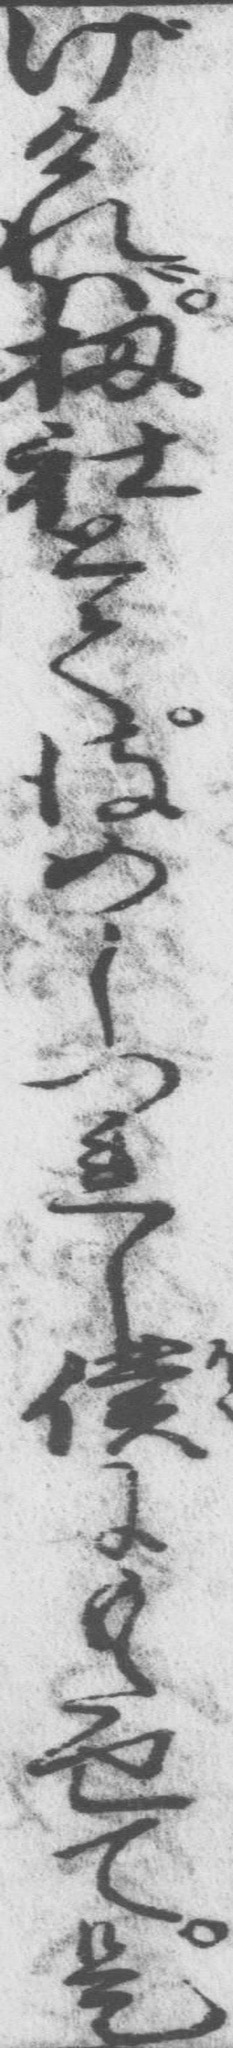けければ。扨社とて。彼めしつれし僕にもたせて。是
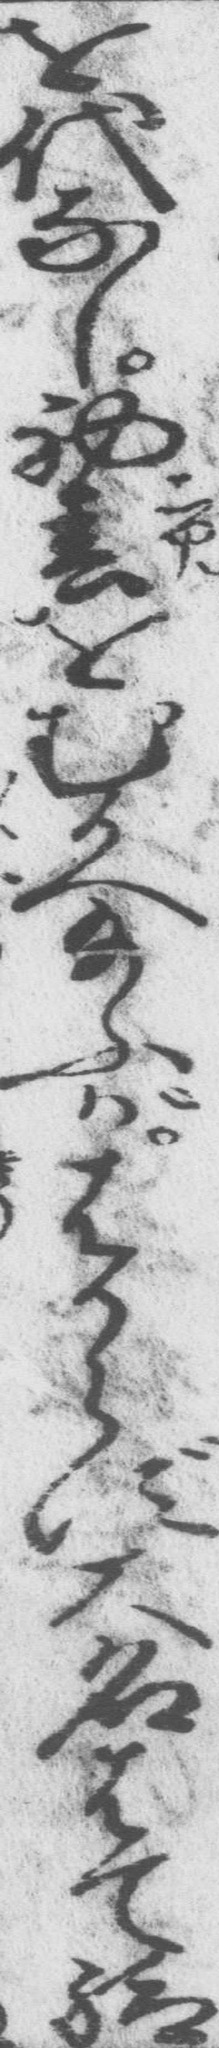を代なし。初春をむかへ給ふが。はからず大名はて給
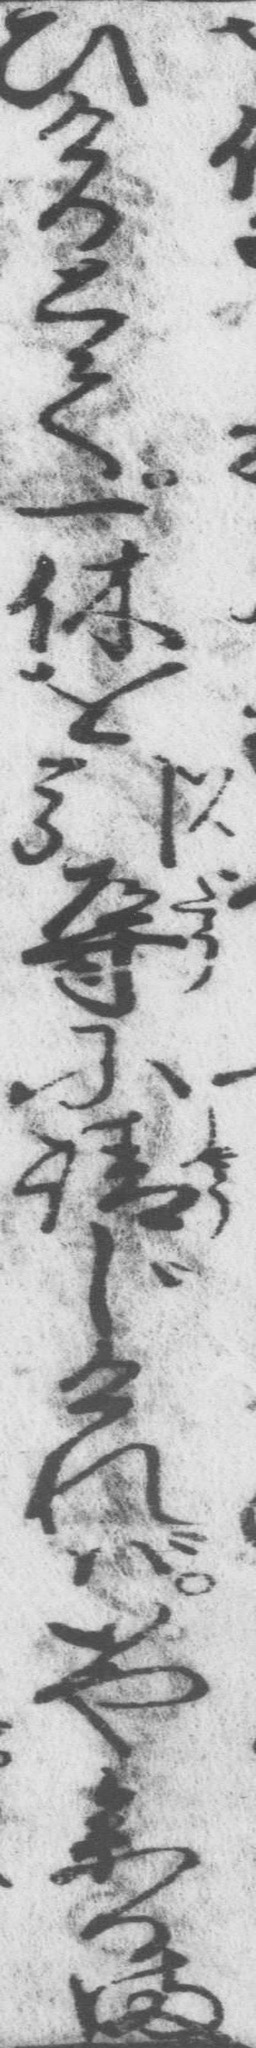ひけるとて。一休を引導に請じければ。いや参るま
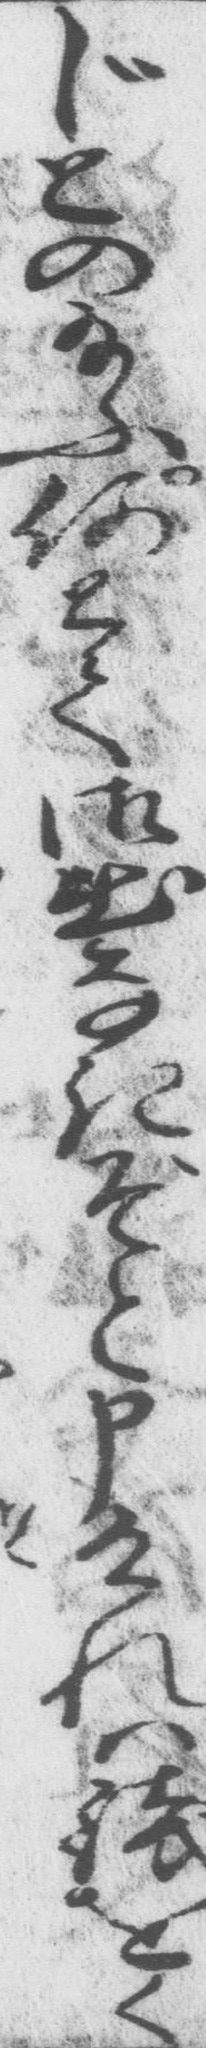じとの給ふ。何とて御出なきぞと申ければ。銭をく
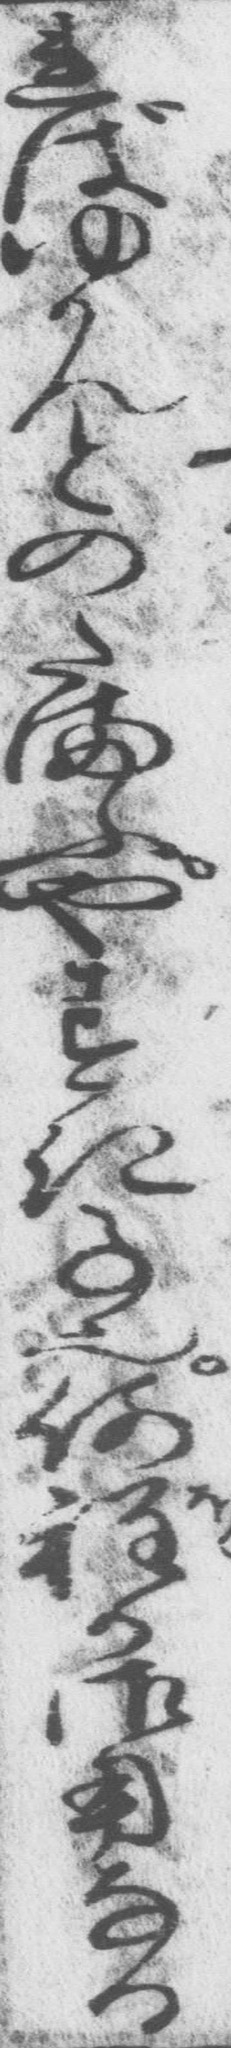ればゆかんとのたまふ。やすき事也。何程か御用なる

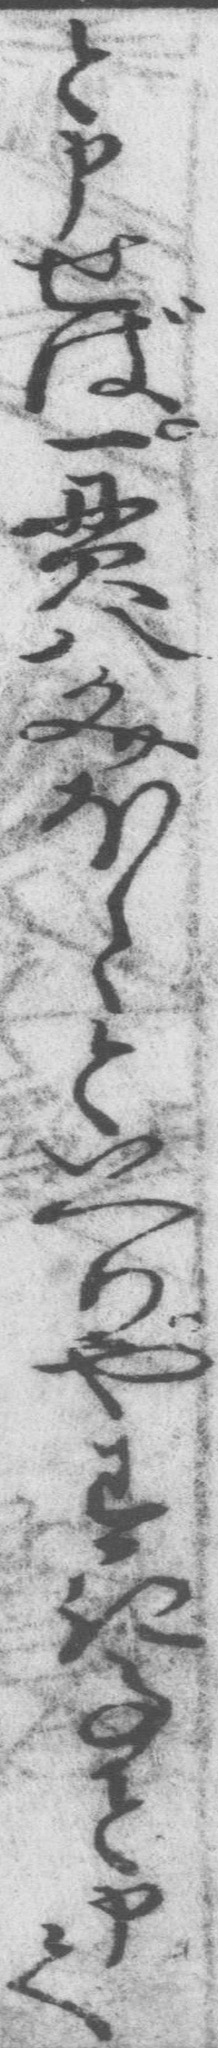と申せば。一なは八文ほとといへり。やすき事を申て
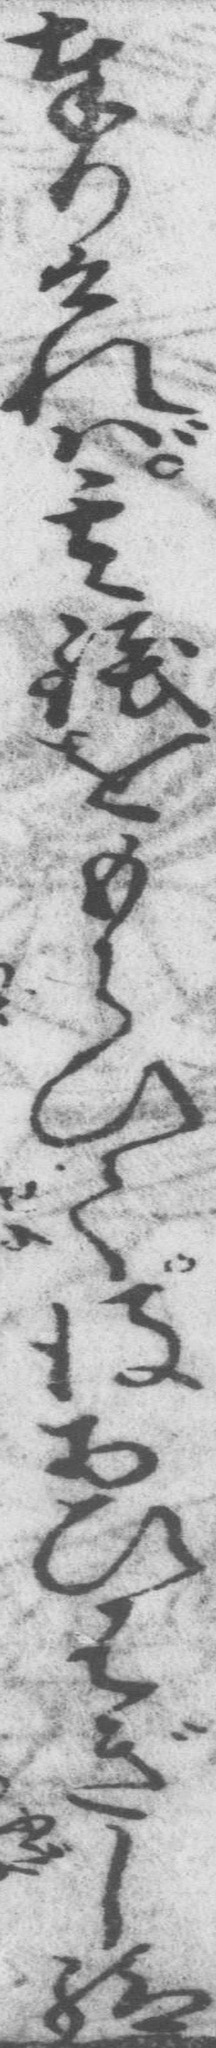奉りければ。其銭をもらひて。彼おひはぎし給
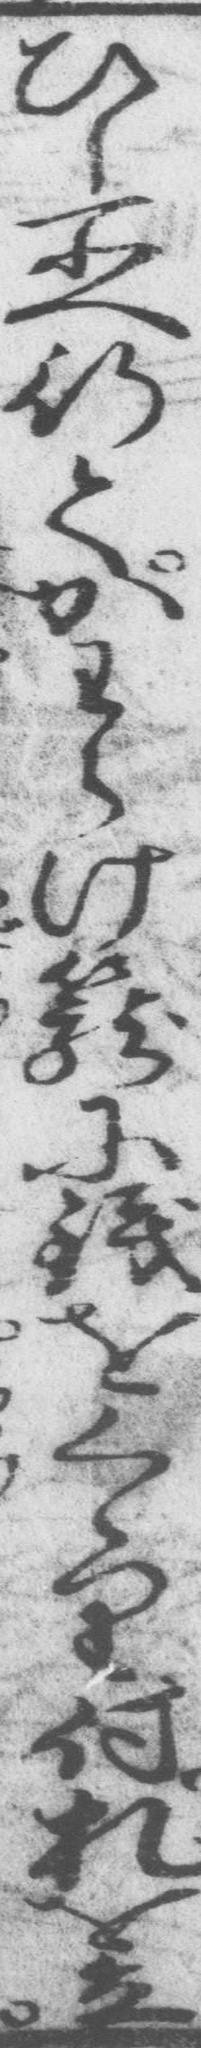ひし所へ行て。かわらけ篭に銭をくゝり付。札を立
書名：一休はなし（元禄十三）
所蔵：大阪公立大学中百舌鳥図書館 国文学研究資料館
